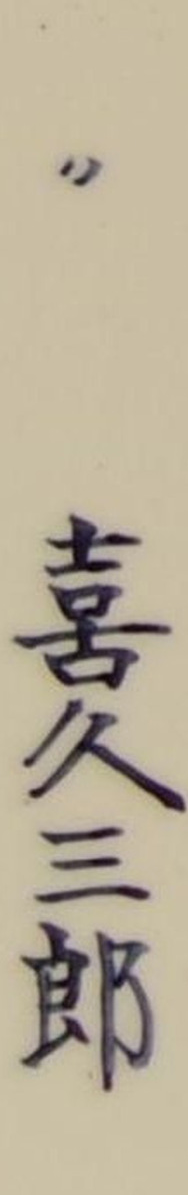喜久三郎
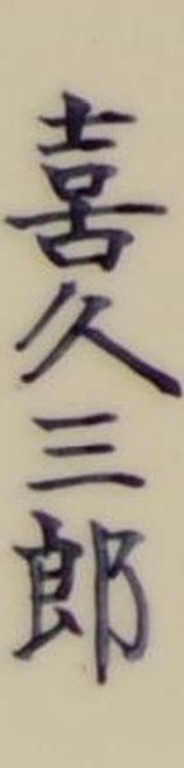喜久三郎

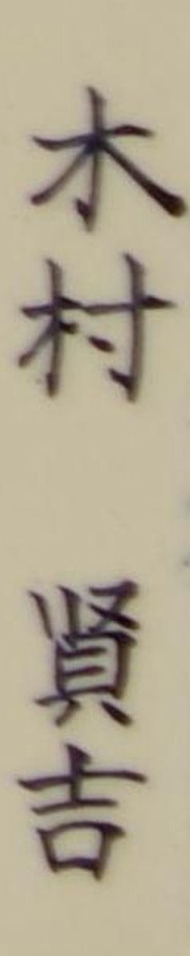木村賢吉
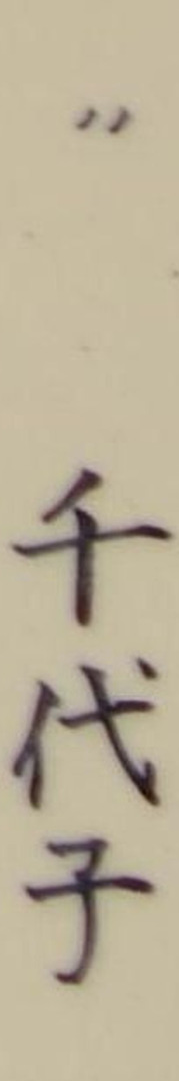千代子
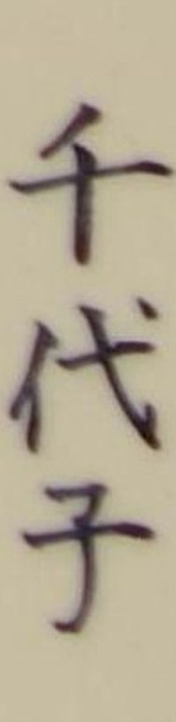千代子
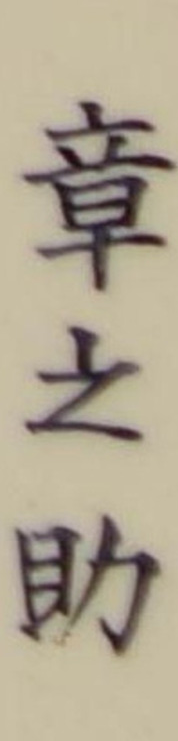章之助
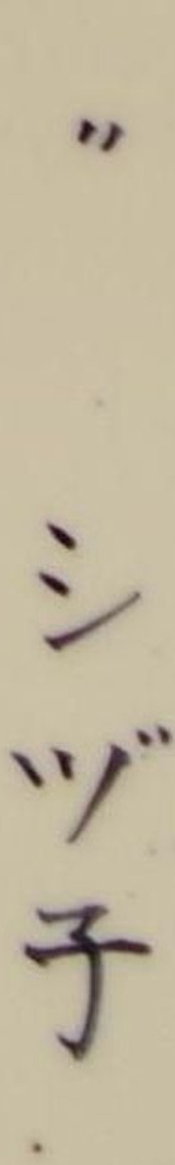シヅ子
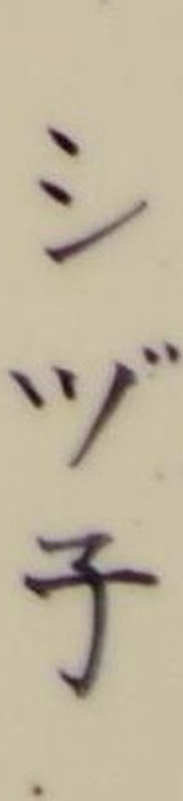シヅ子
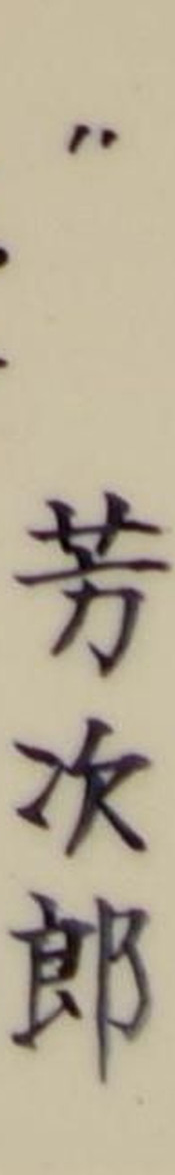芳次郎
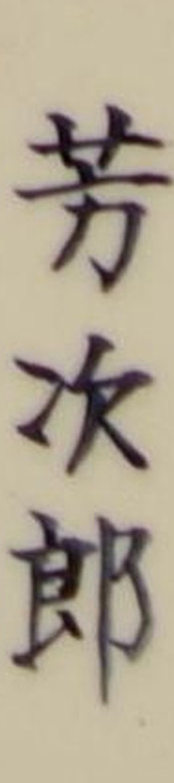芳次郎
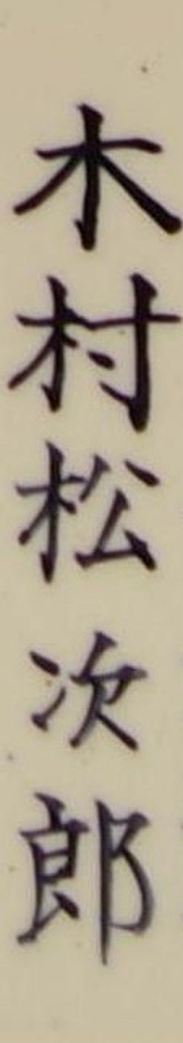木村松次郎
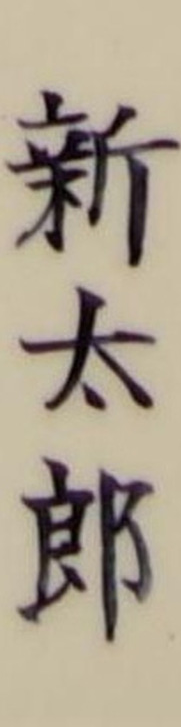新太郎
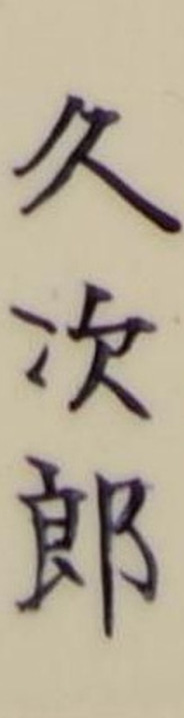久次郎
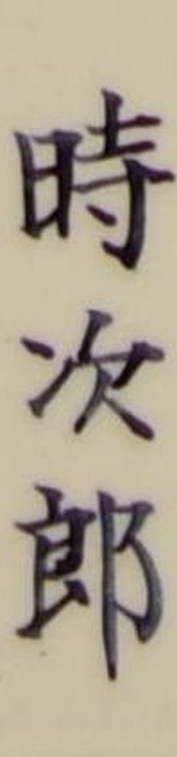時次郎
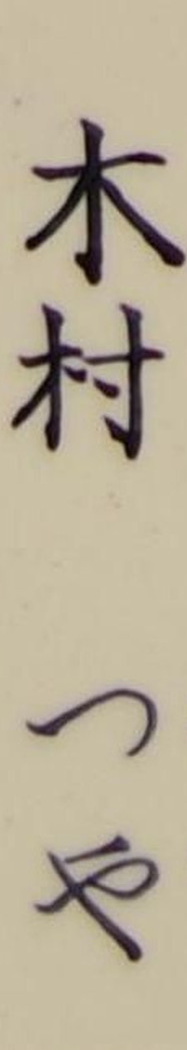木村つや
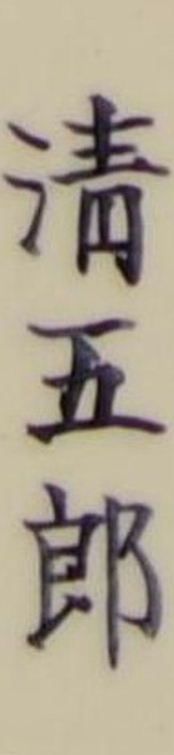清五郎
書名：E~L
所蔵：高野山金剛峯寺
